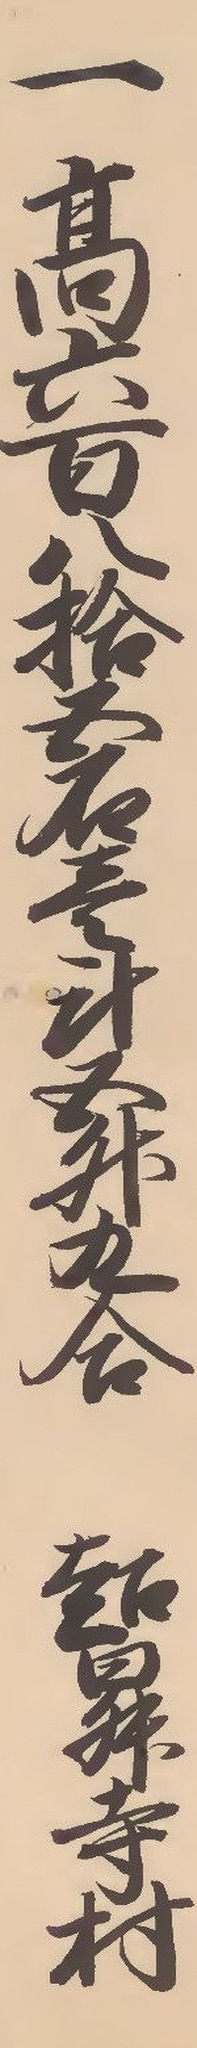一高六百八拾五石壱斗五升九合超昇寺村

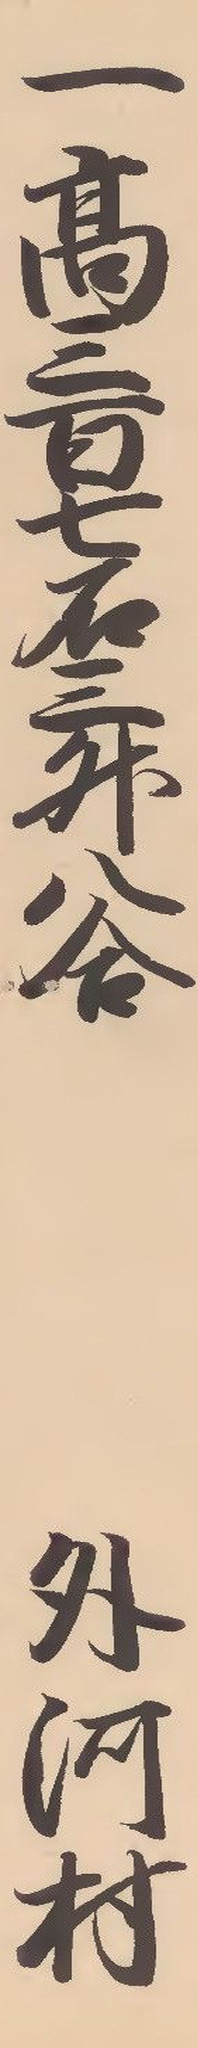一高三百七石三升八合外河村
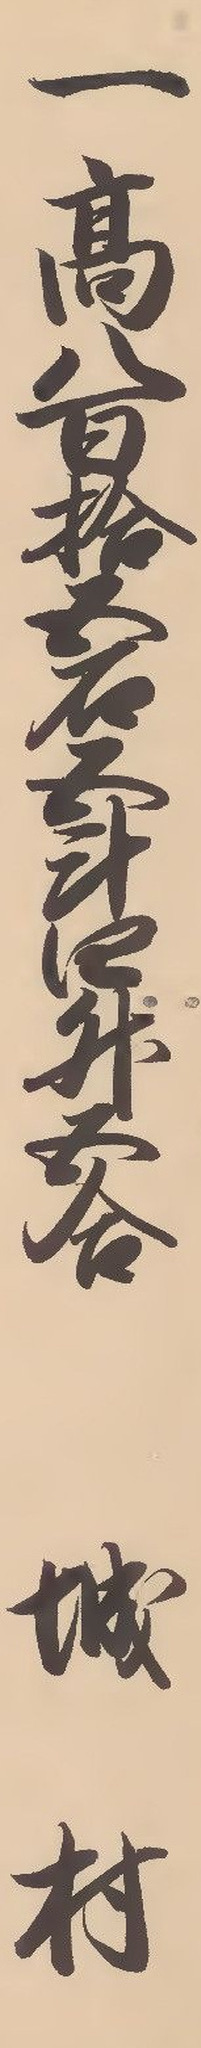一高八百拾五石五斗四升五合城村
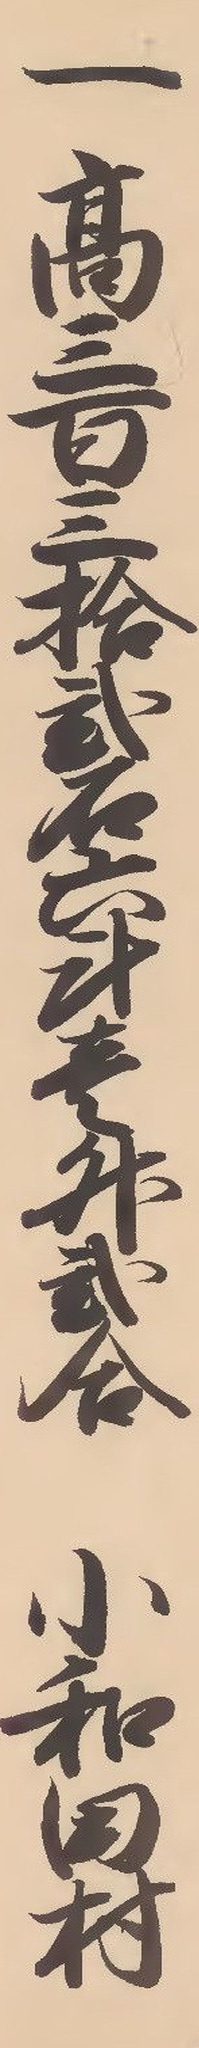一高三百三拾弐石六斗壱升弐合小和田村
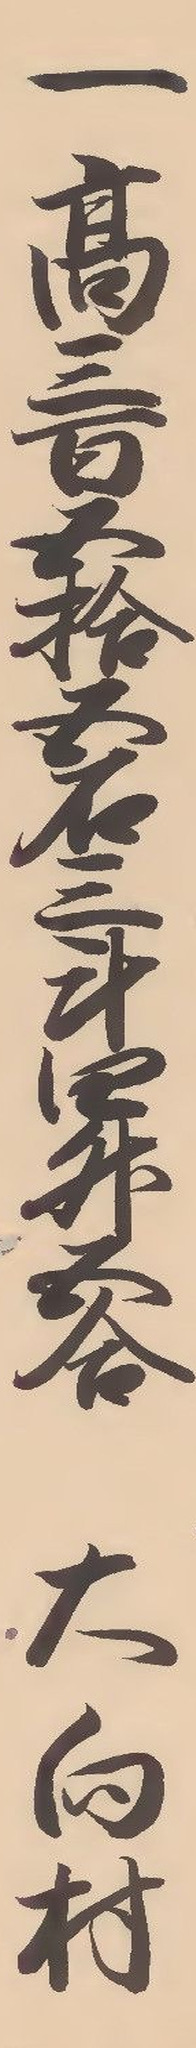一高八百拾五石五斗四升五合城村

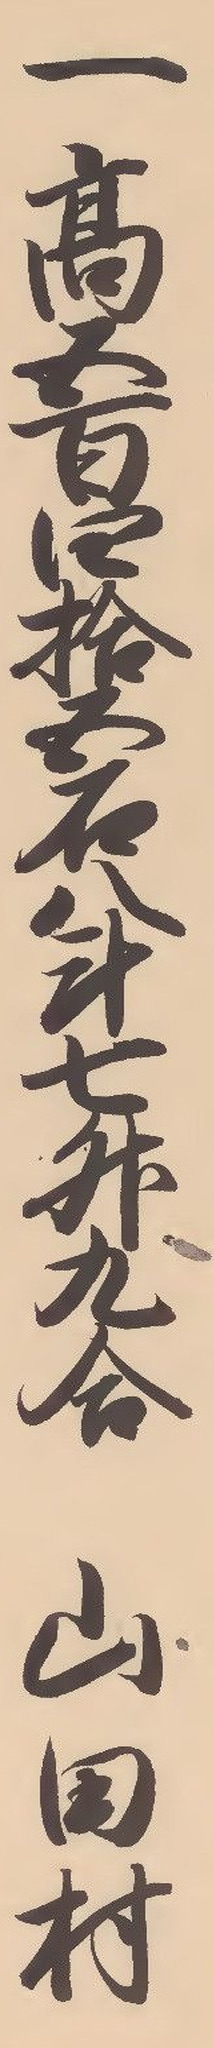一高五百四拾五石八斗七升九合山田村
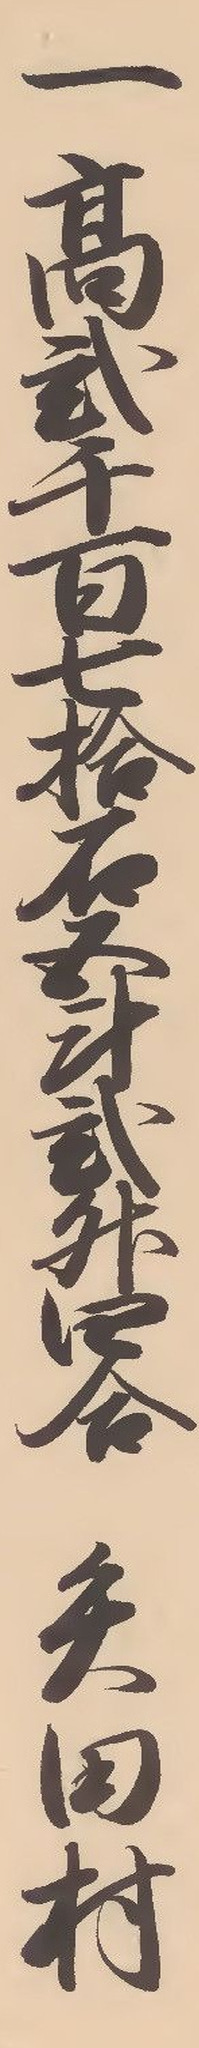一高弐千百七拾石五斗弐升四合矢田村
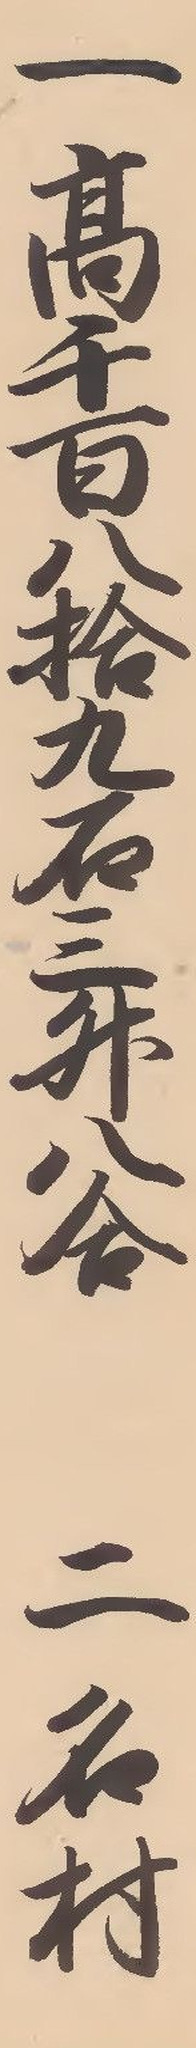一高千百八拾九石三升八合二名村

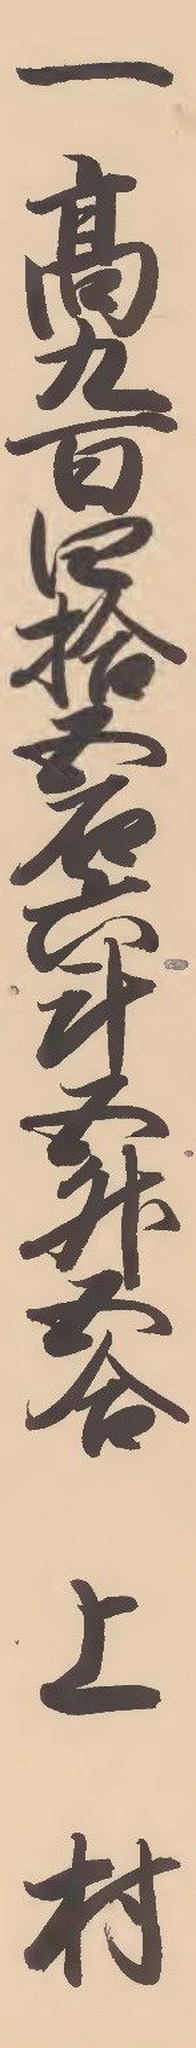一高九百四拾五石六斗五升五合上村
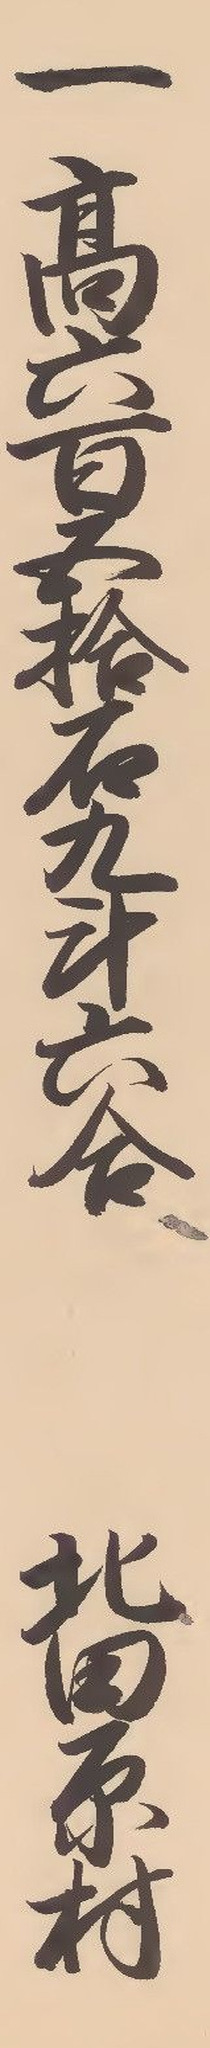一高六百五拾石九斗六合北田原村
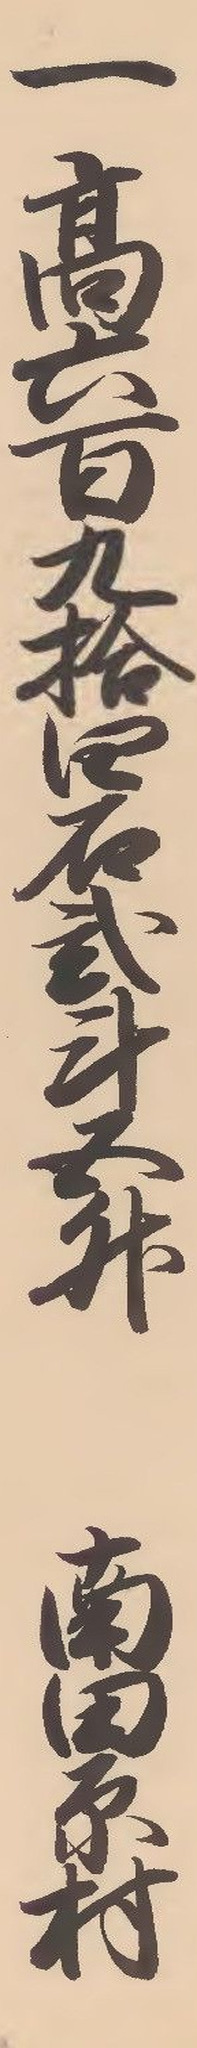一高六百九拾四石弐斗五升南田原村
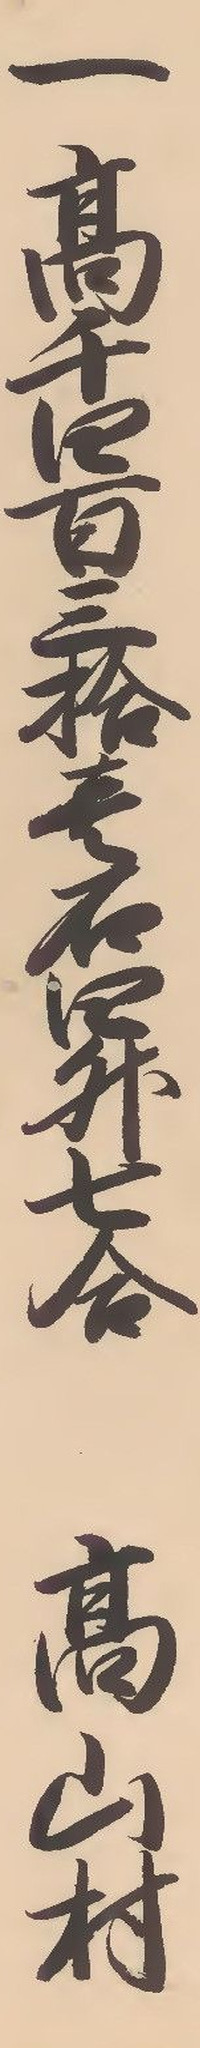一高千四百三拾壱石四升七合高山村
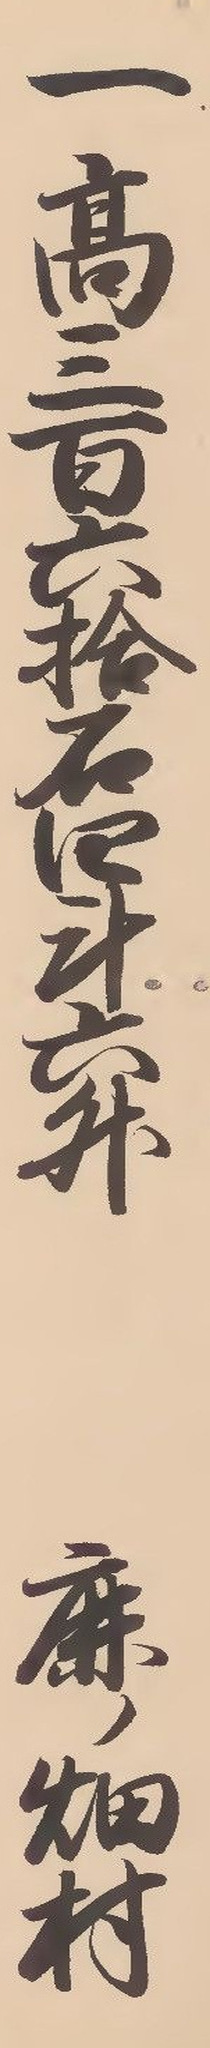一高三百六拾石四斗六升鹿ノ畑村
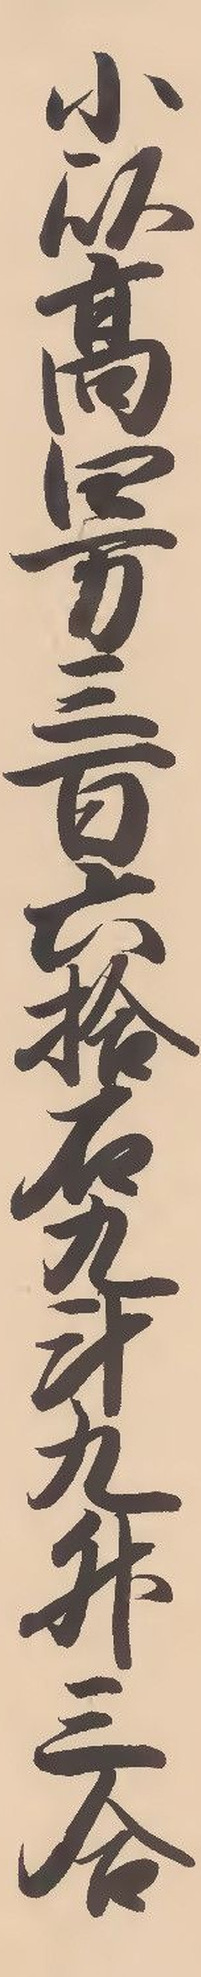小以高四万三百六拾石九斗九升三合

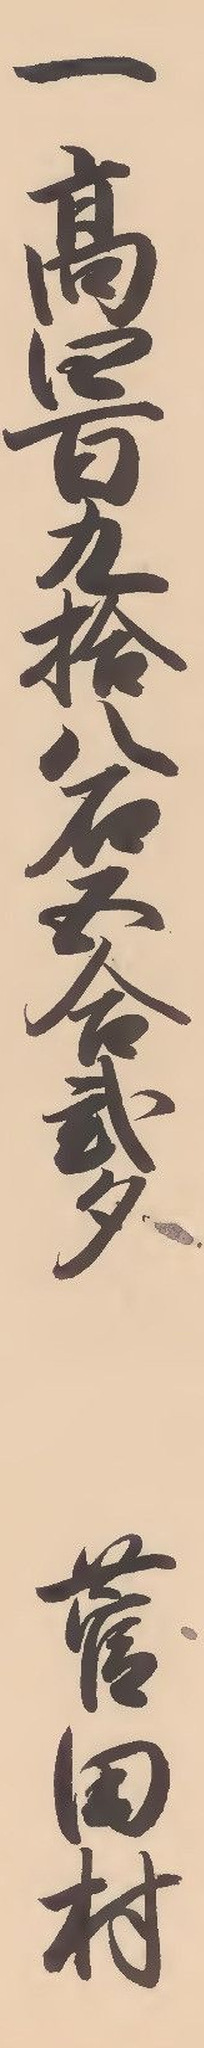一高四百九拾八石五合弐勺菅田村
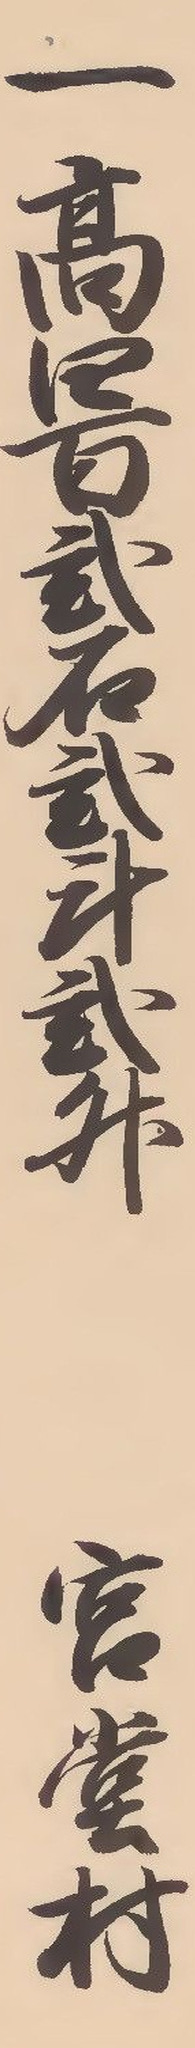一高四百弐石弐斗弐升宮堂村
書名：大和国郷帳
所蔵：国立公文書館 National Archives of Japan
